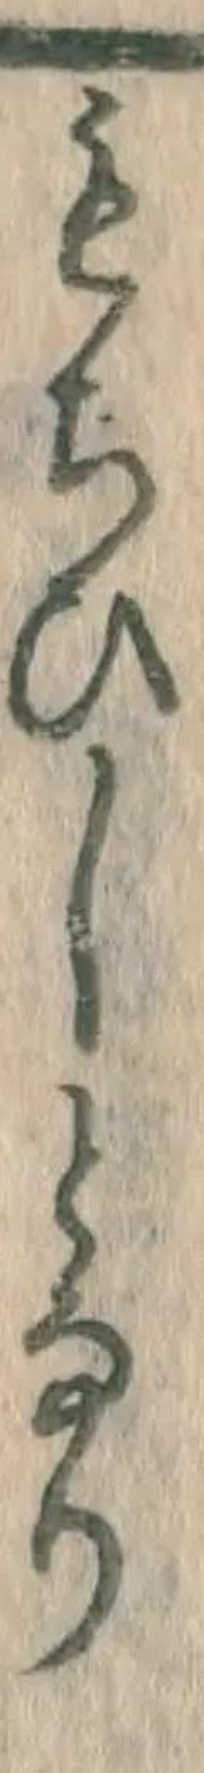もちひしとなり

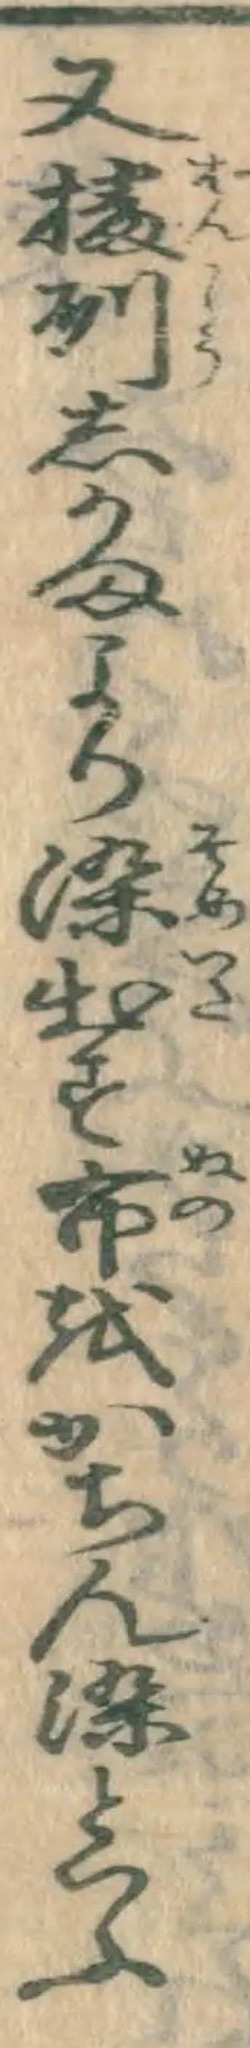又播州しかまより染出す布をかちん染といふ
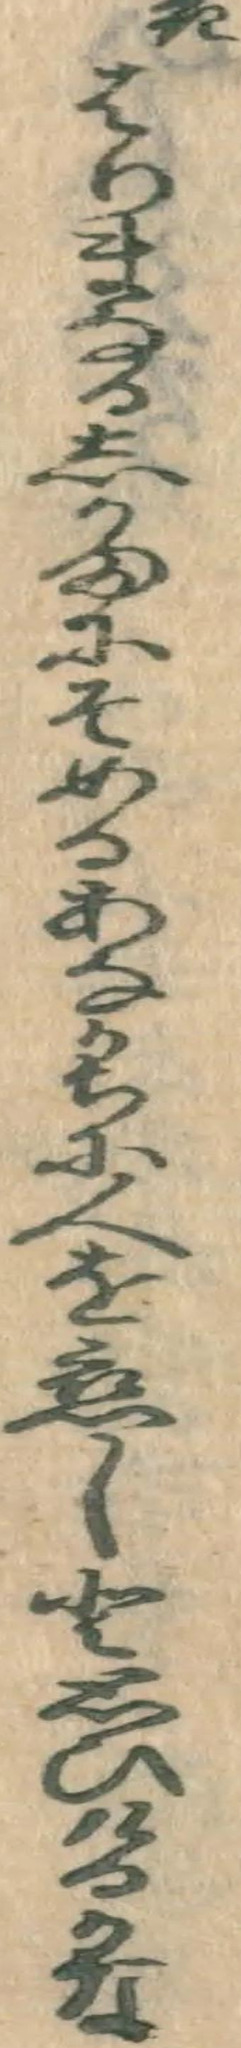詞花はりまなるしかまにそめるあなかちに人を恋しと思ひけるかな
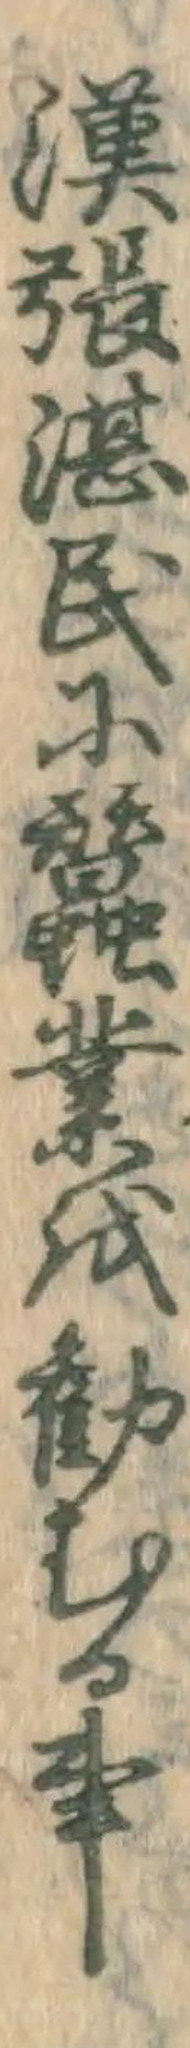漢張湛民に蚕業を勧むる事
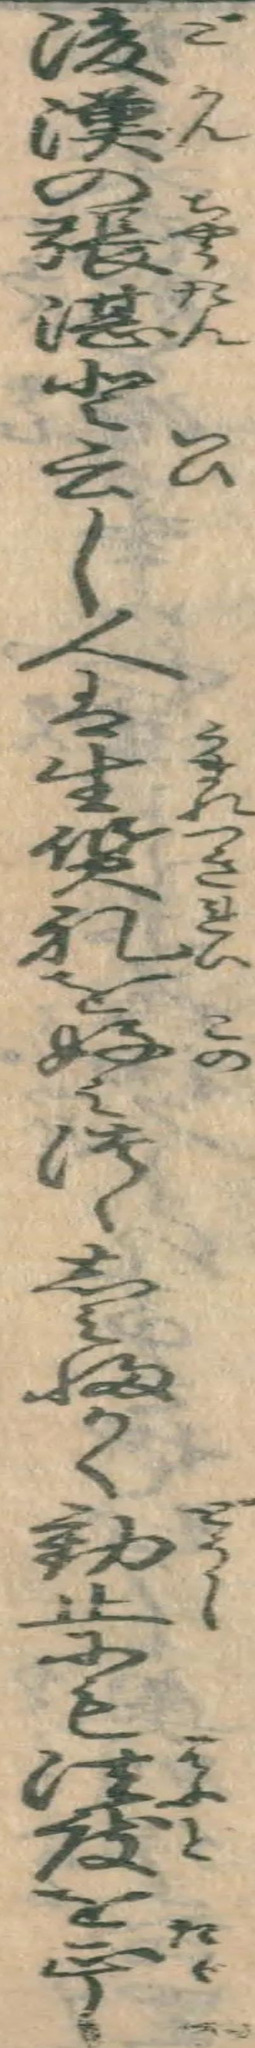後漢の張湛と云し人は生質礼を好みつゝしみふかく動止にも法度を正し
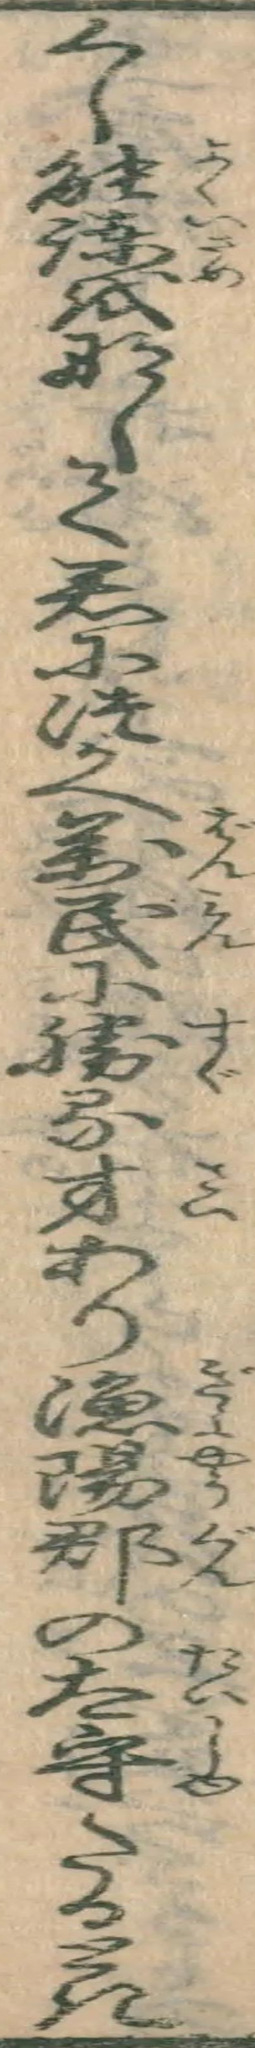くし能諌をなして君につかへ万民に勝る才あり漁陽郡の太守たるとき
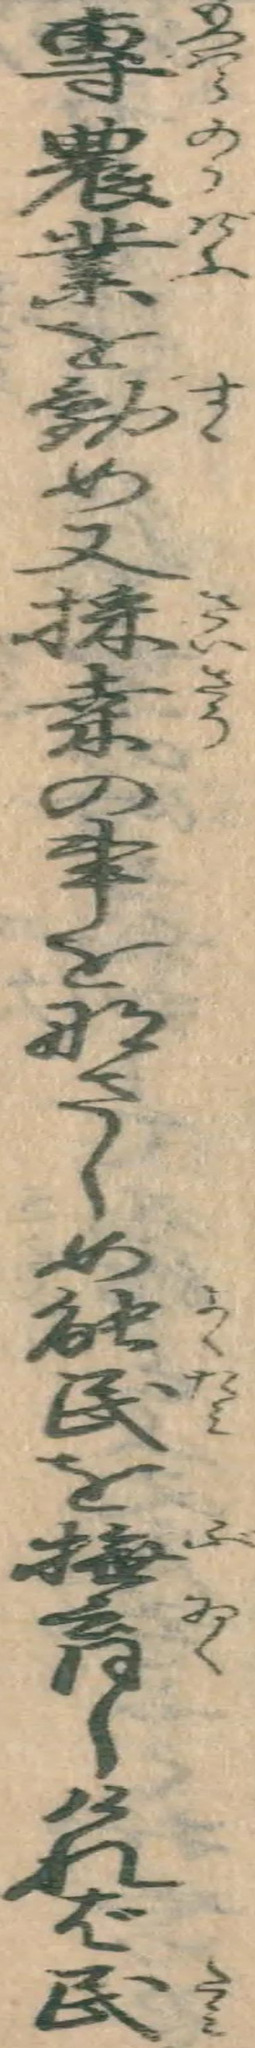専農業を勧め又採桑の事をなさしめ能民を撫育しければ民
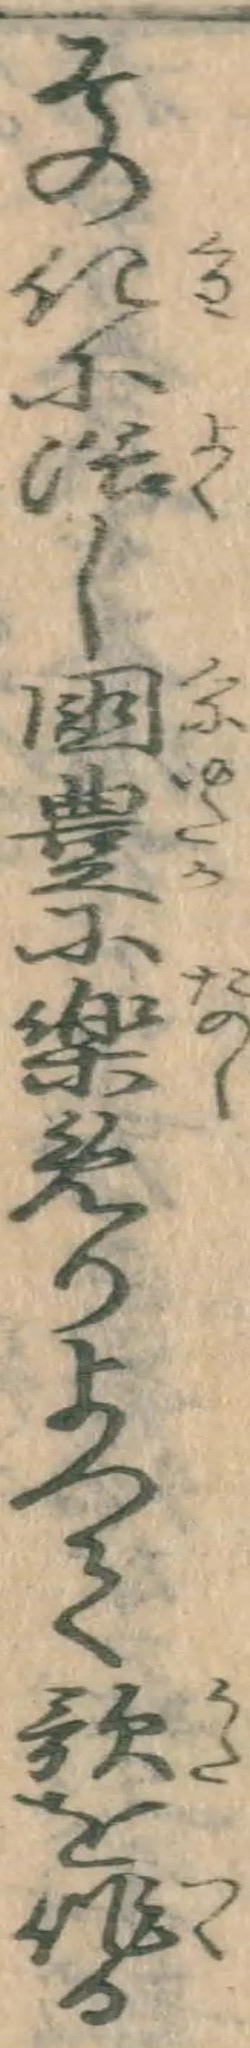その化に浴し国豊に楽めりよつて歌を作る
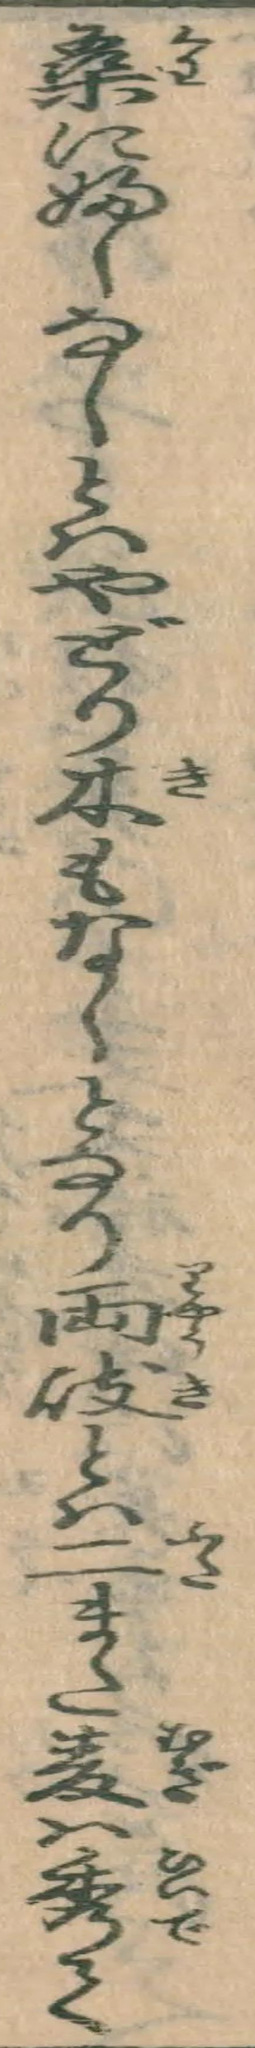桑にふしなしとはやどり木もなしとなり両岐とは二また麦は秀て
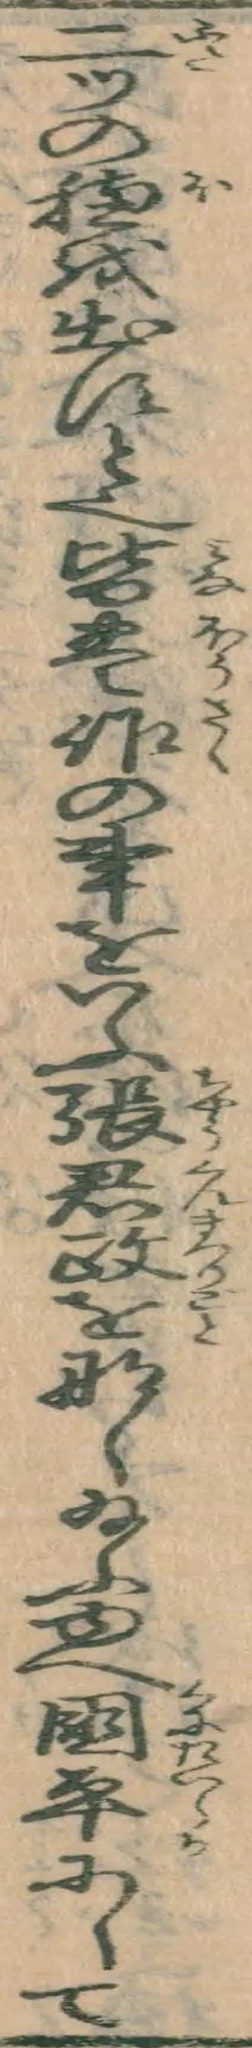ニツの穂を出すと也皆豊作の事をいふ張君政をなし給ふゆへ国平にして
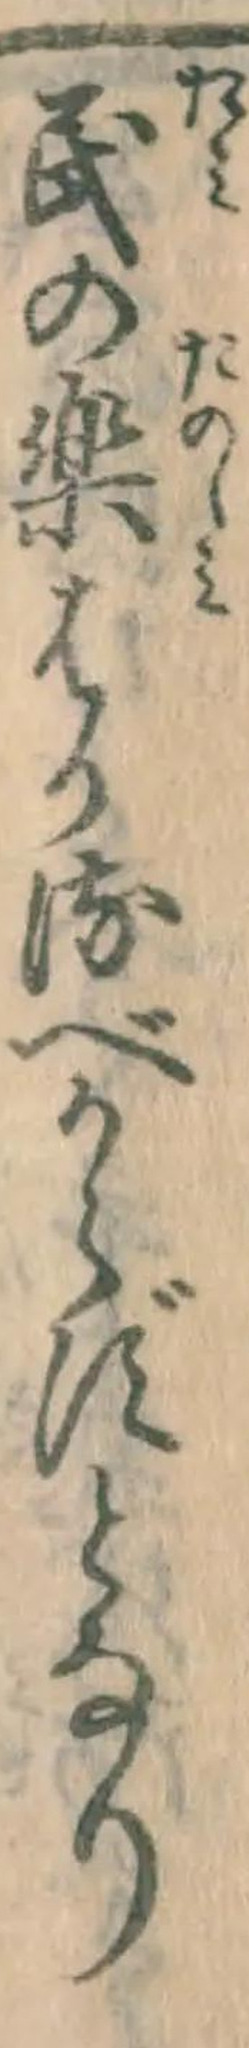民の楽はかるべからずとなり
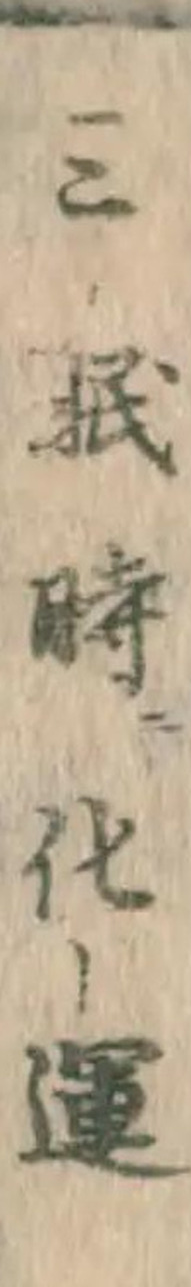三-眠時化-運
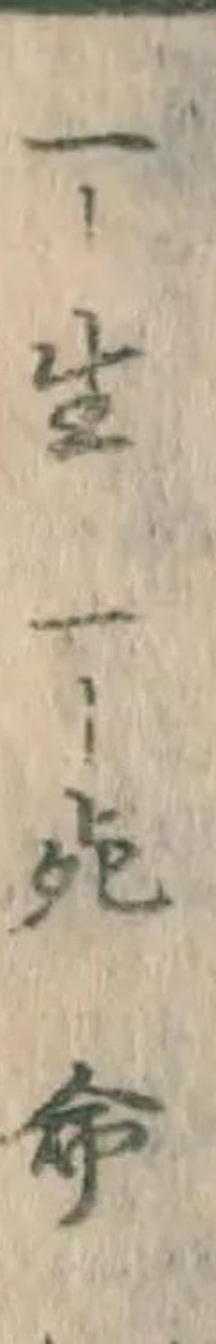一-生一-死命
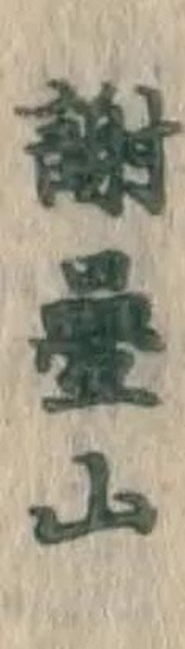謝疊山

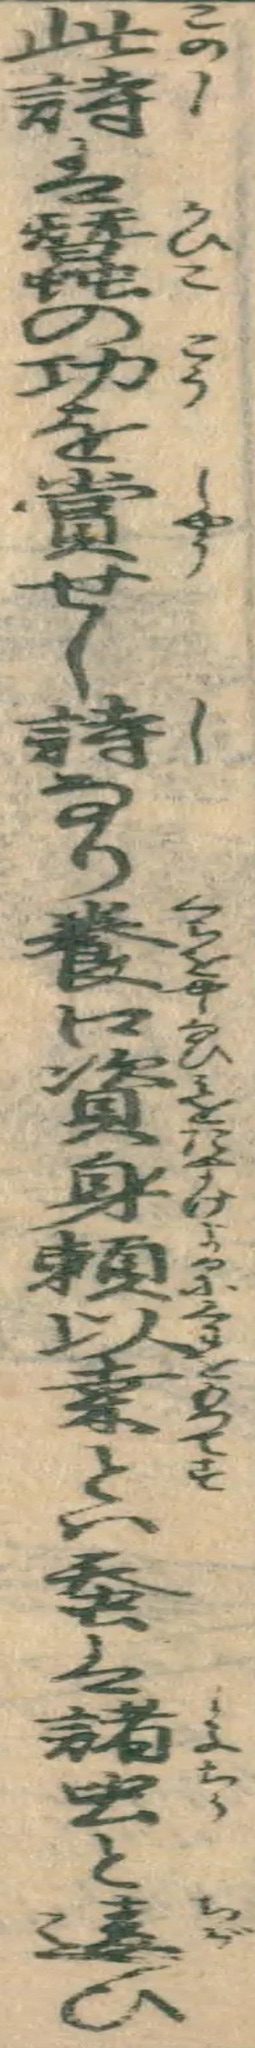此詩は蚕の功を賞せし詩なり養口資身頼以桑とは蚕は諸虫と違ひ
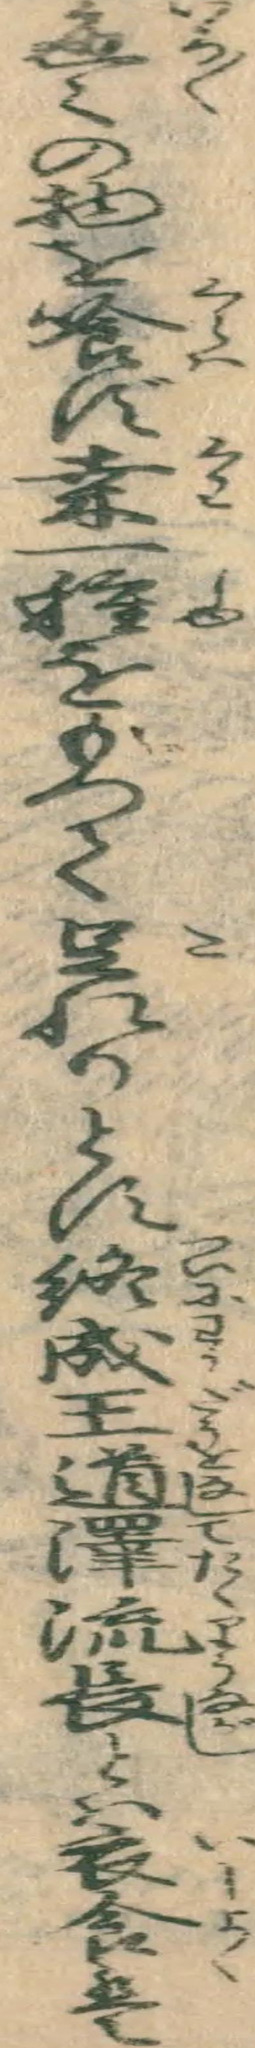色々の物を喰ず桑一種をもって足れりとす終成王道沢流長とは衣食は
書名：養蚕秘録 3巻. [3]
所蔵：国立国会図書館 National Diet Library, JAPAN
